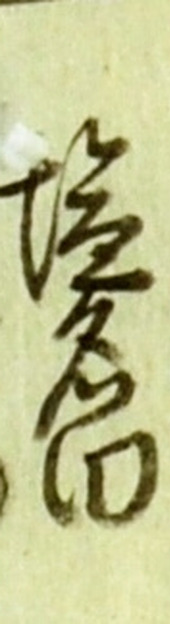塩名田
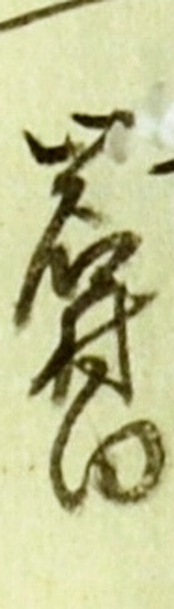岩村田
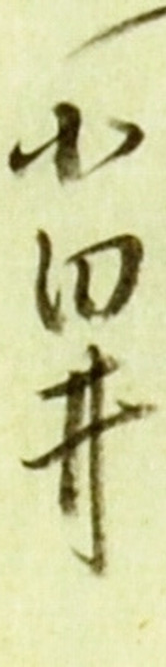小田井

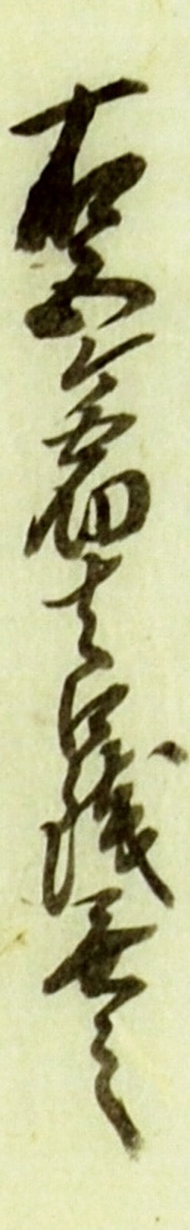右五ヶ宿者口銭無之
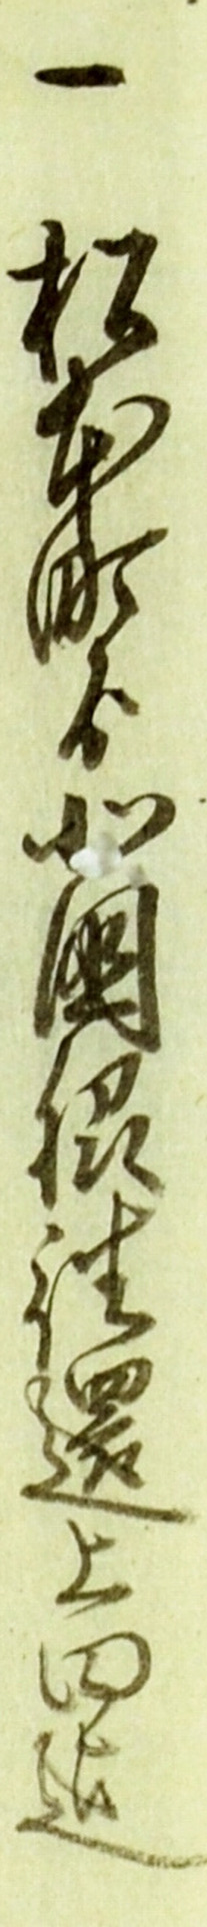一松本町ゟ北国脇往還上田迄
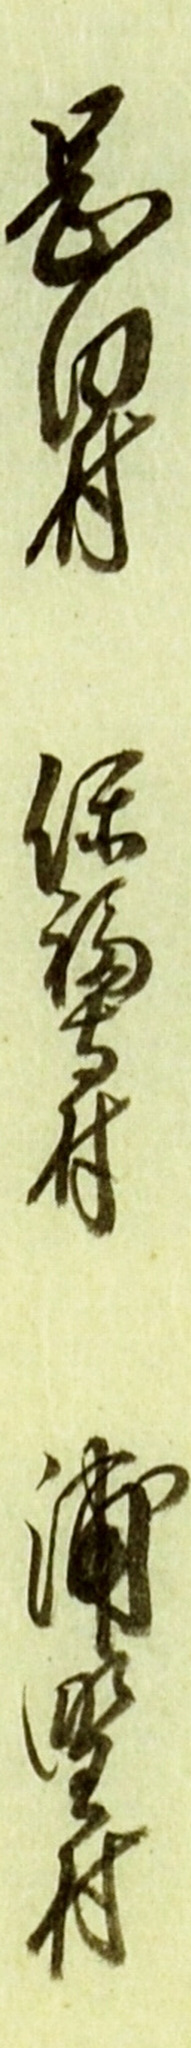岡田村保福寺村浦野村
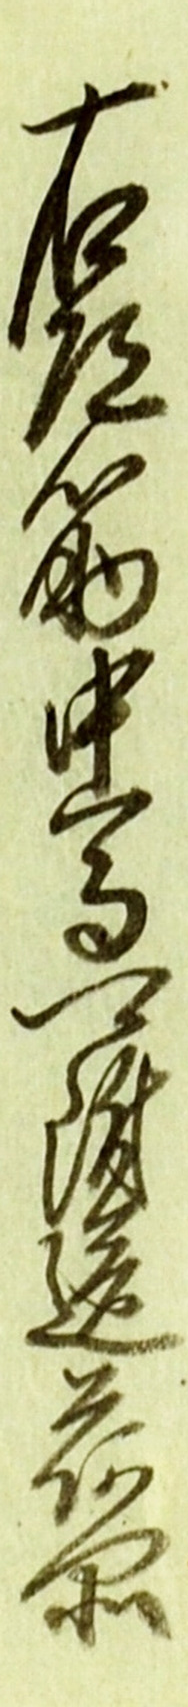右道筋中馬可附送荷品
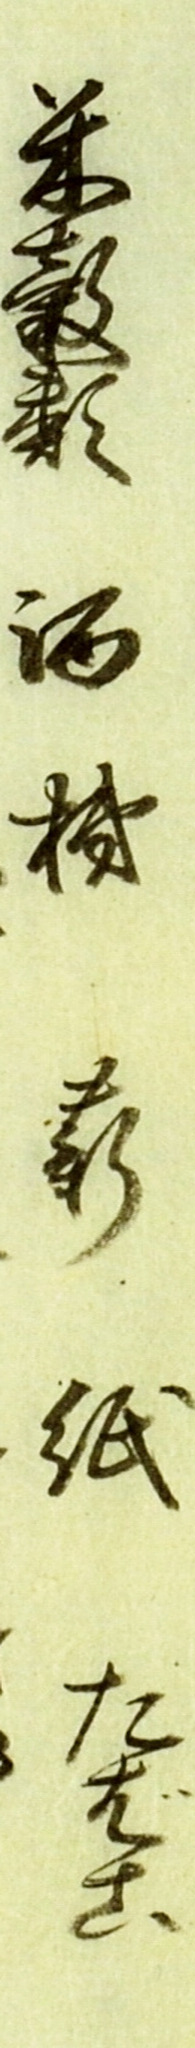米穀類酒柿薪紙たばこ
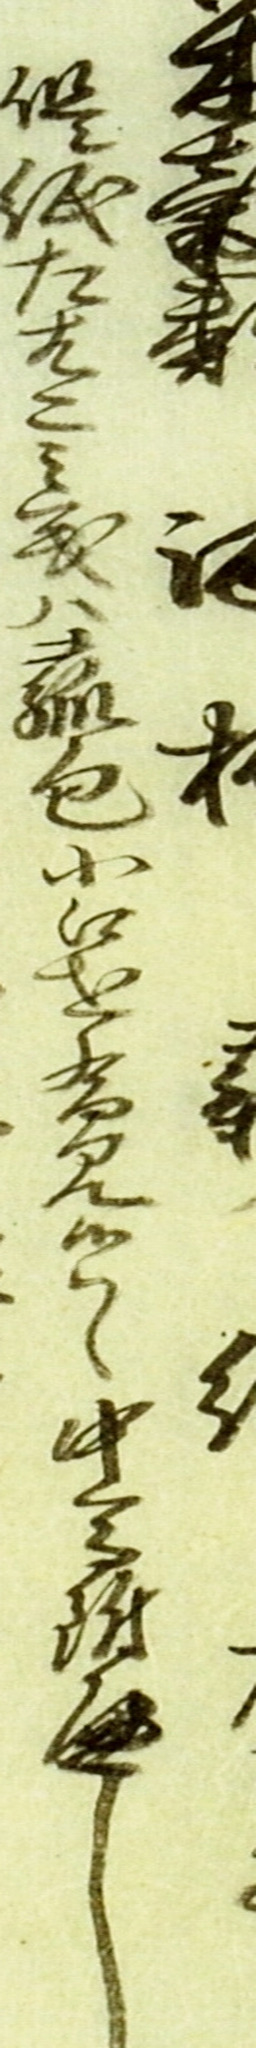但シたはこ之義ハ菰包小口を有見候ハヽ中馬附へし
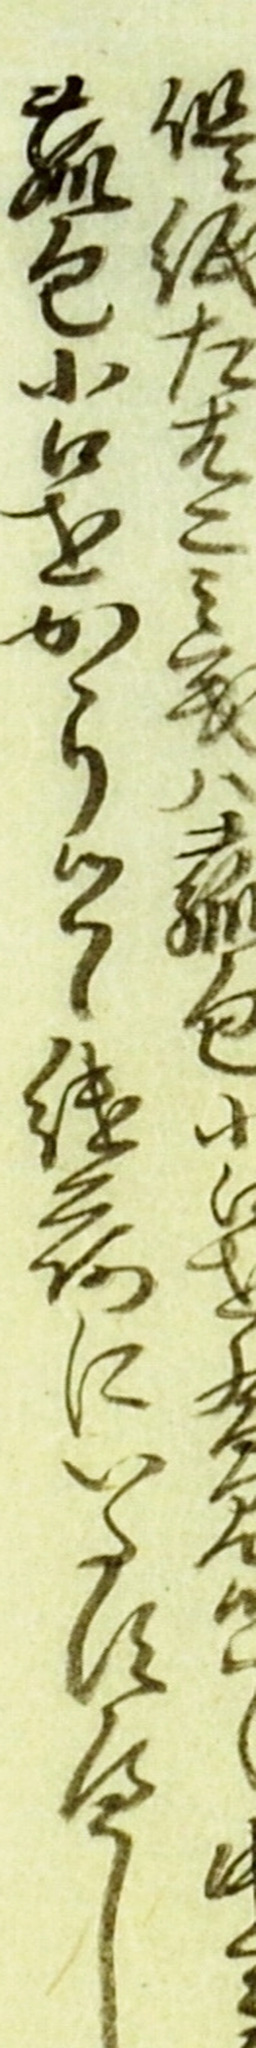菰包小口をかゝり候ハヽ継荷にいたすへし
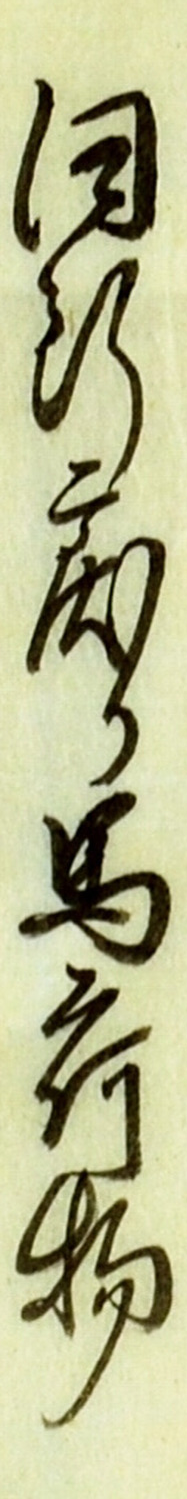同断戻り馬荷物
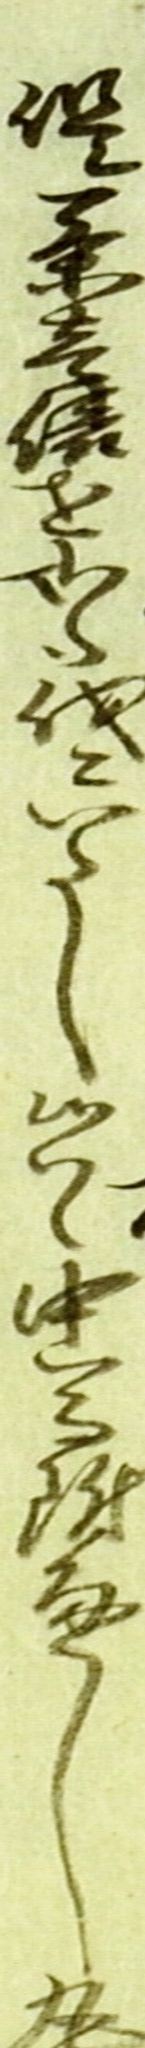但シ茶壱俵を弐御伐々いたし候ハヽ中馬附へし
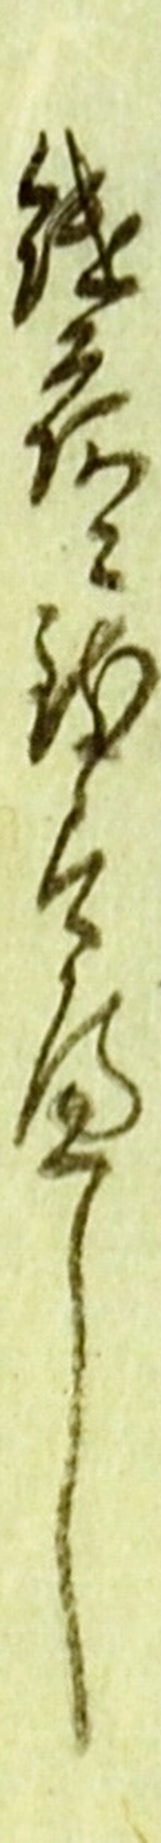継荷ニ致すへし
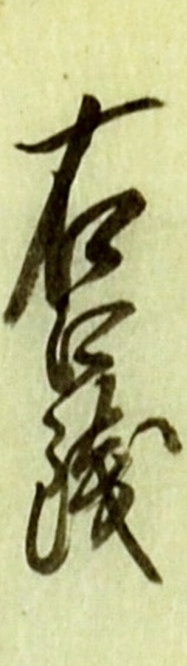右口銭
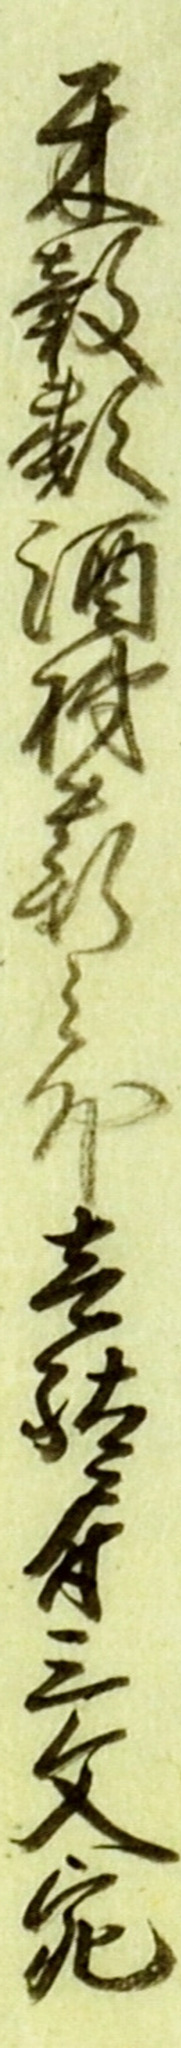米穀類酒柿薪之外壱駄ニ付三文宛
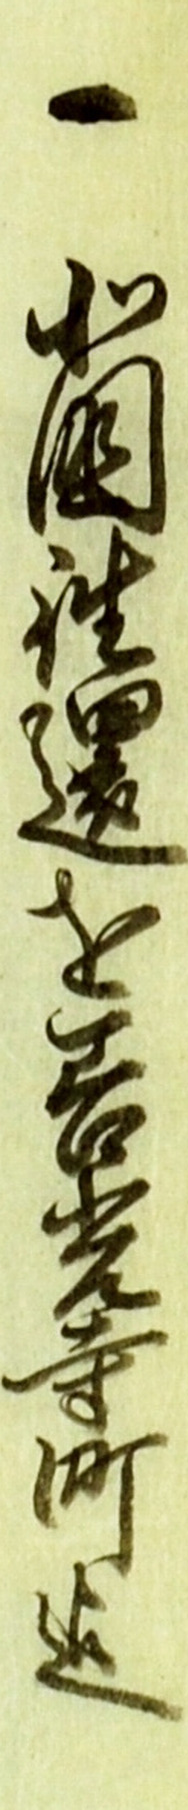一北国往還を善光寺町迄
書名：中馬荷物并口銭中馬稼之村名馬数等申渡書
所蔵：伊那市立高遠町図書館・合同会社AMANE
